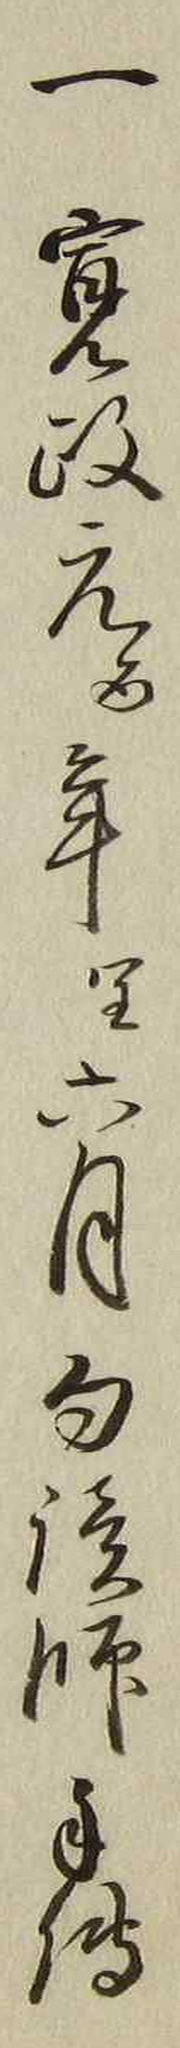一寛政元酉年閏六月句読師手伝
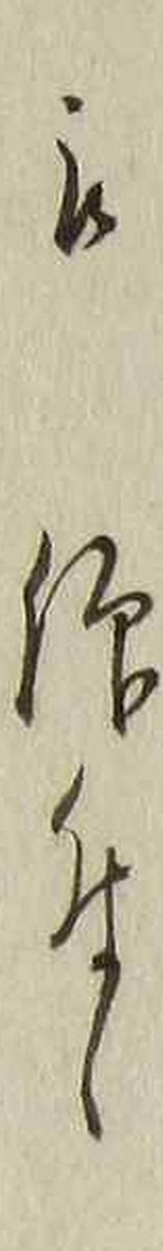被仰付候
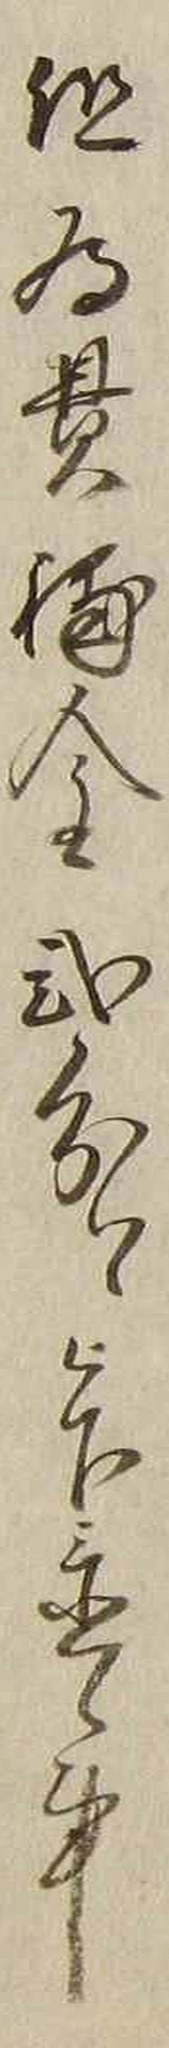但為費補金弐分つゝ被下置候事
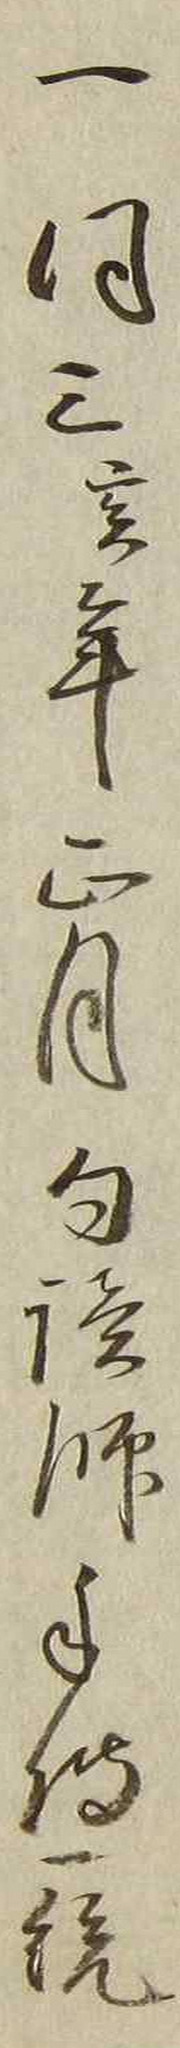一同三亥年正月句読師手伝一統

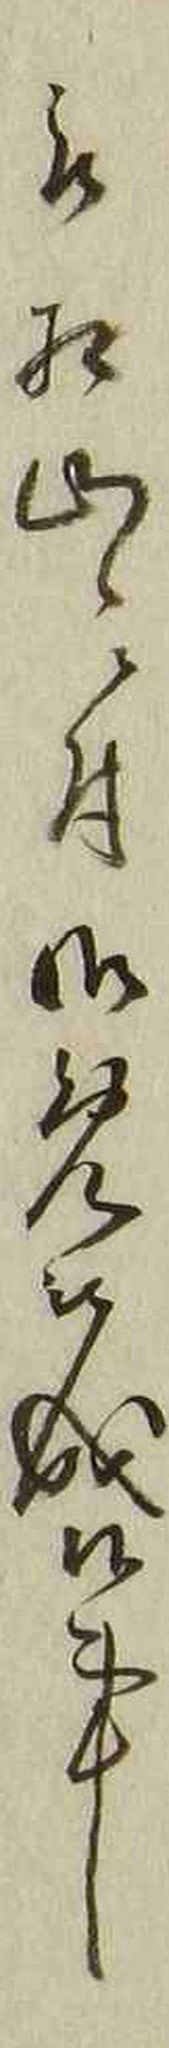被相止候ニ付御免被成候事
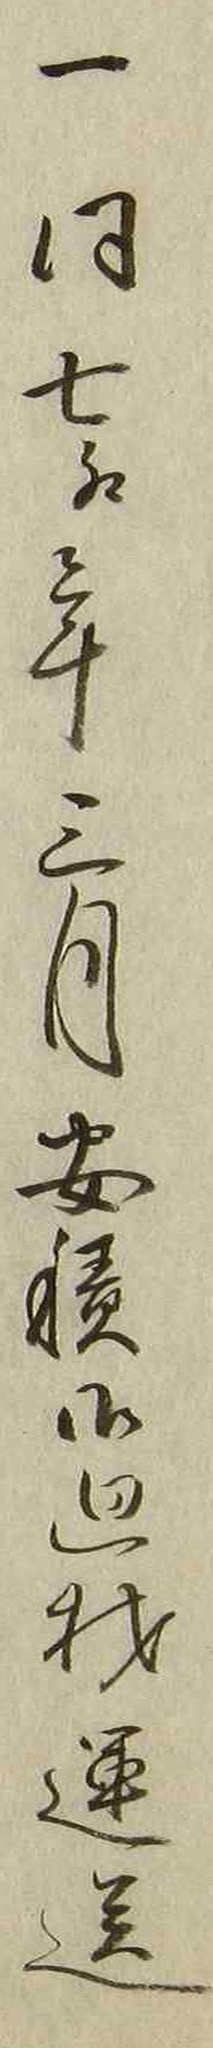一同七卯年三月安積御廻材運送
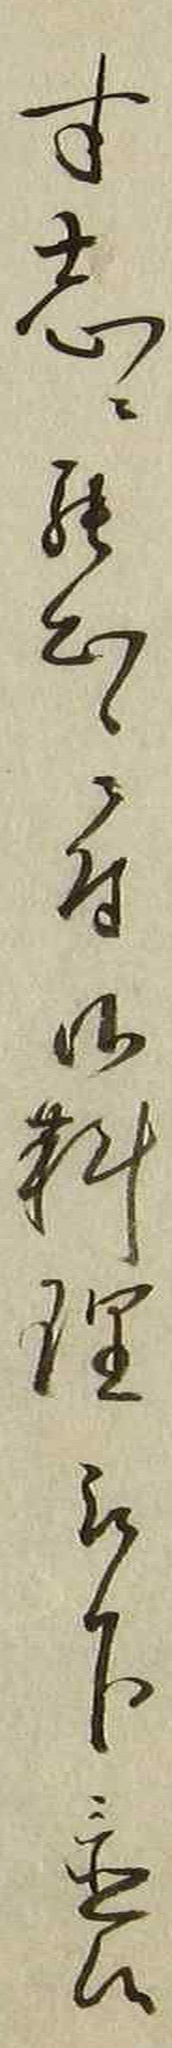寸志ニ罷出候ニ付御料理被下置候
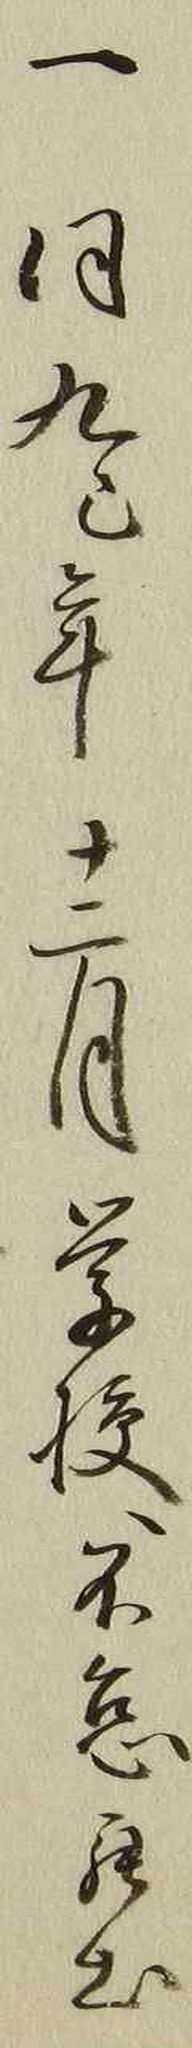一同九巳年十二月学校へ不怠罷出
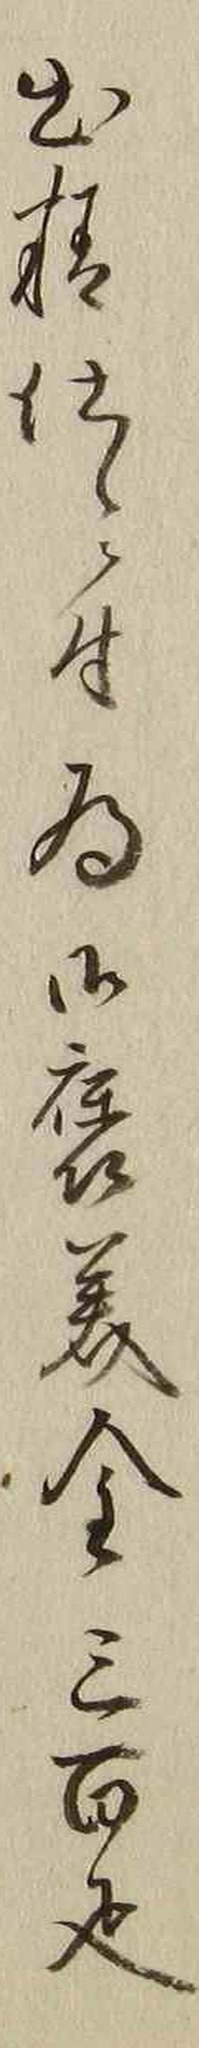出精仕候ニ付為御褒美金三百疋
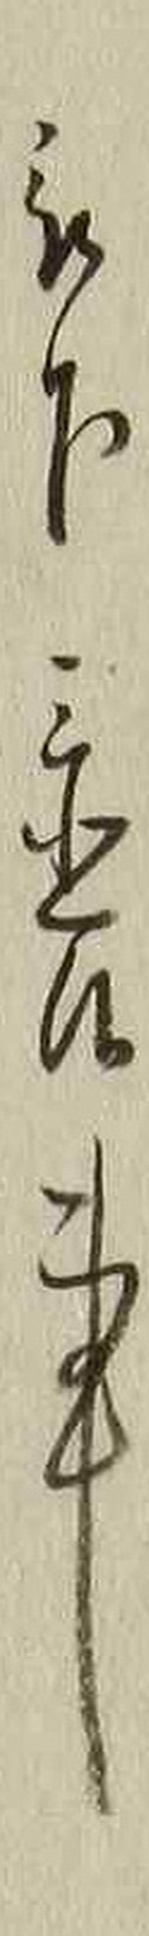被下置候事
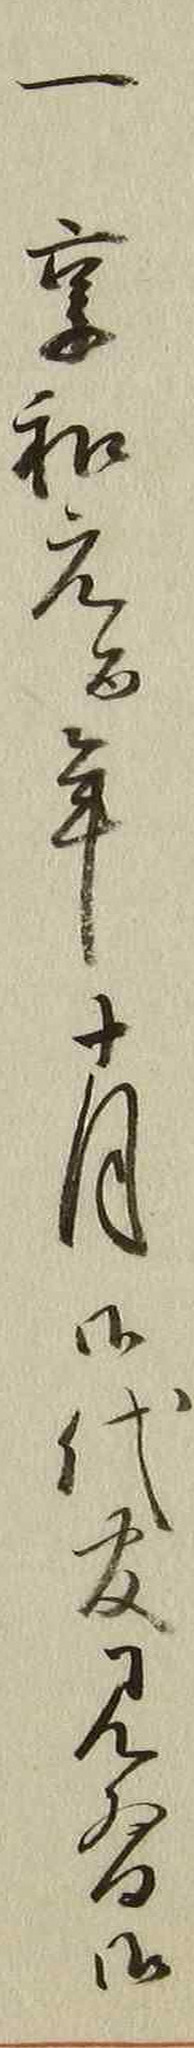一享和元酉年十月御代官見習御
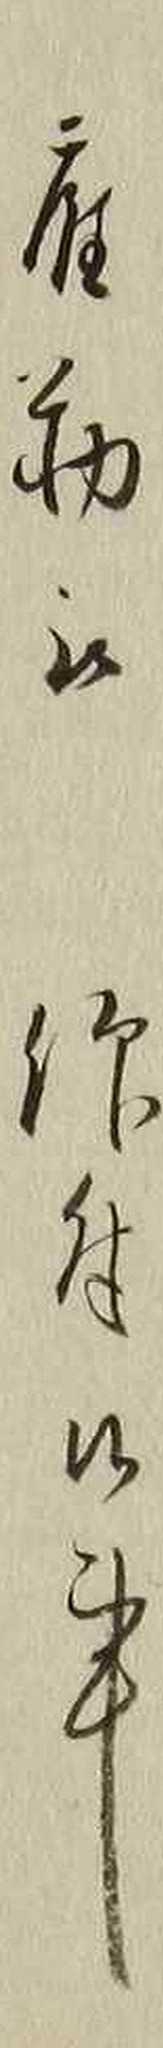雇勤被仰付候事
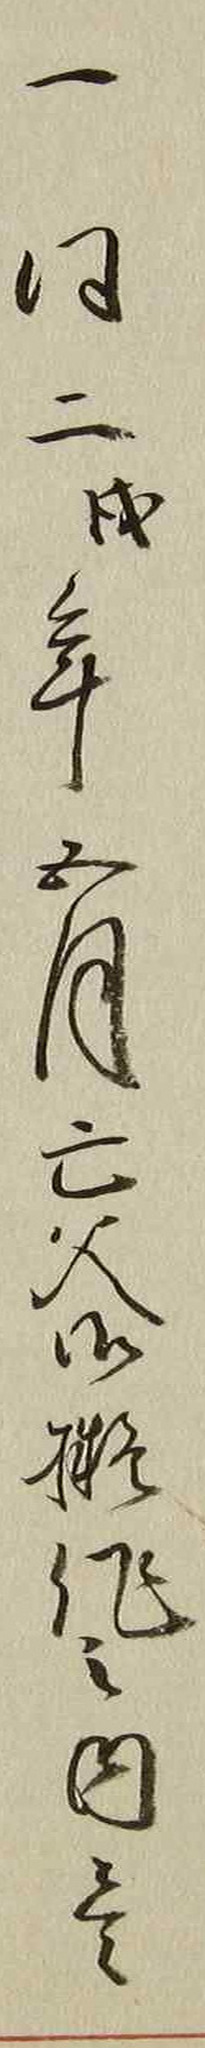一同二戌年五月亡父御擬作之内壱
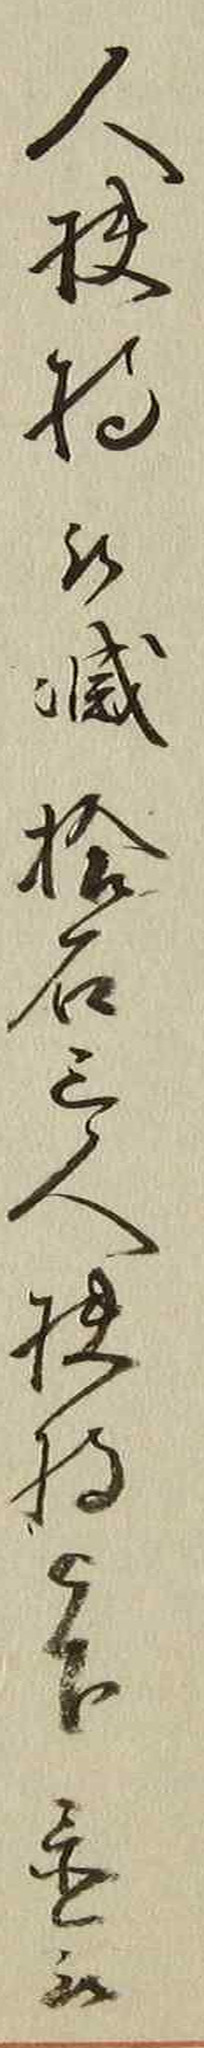人扶持被減拾石三人扶持被下置被
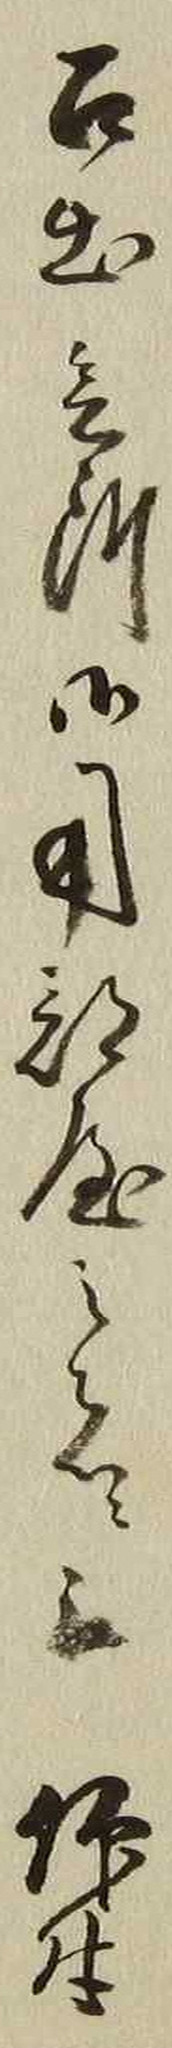召出会所御用部屋之者ニ被仰付
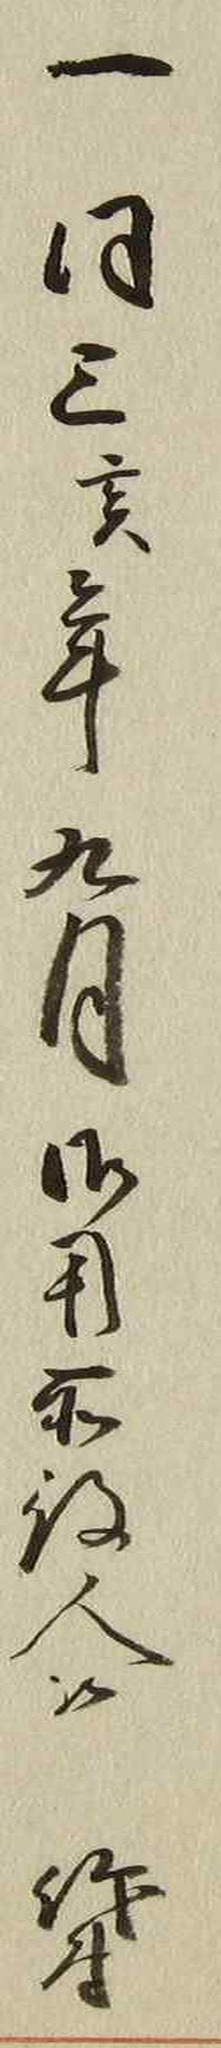一同三亥年九月御用所役人被仰付
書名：諸士系譜　巻之32　い之部32
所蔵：会津若松市立会津図書館
